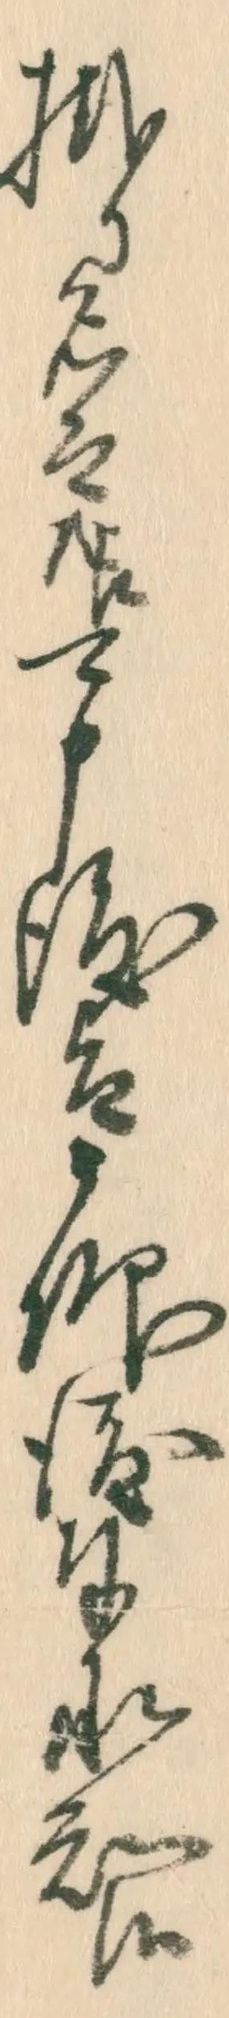掛り名主共え可申渡旨被仰渡奉承知候
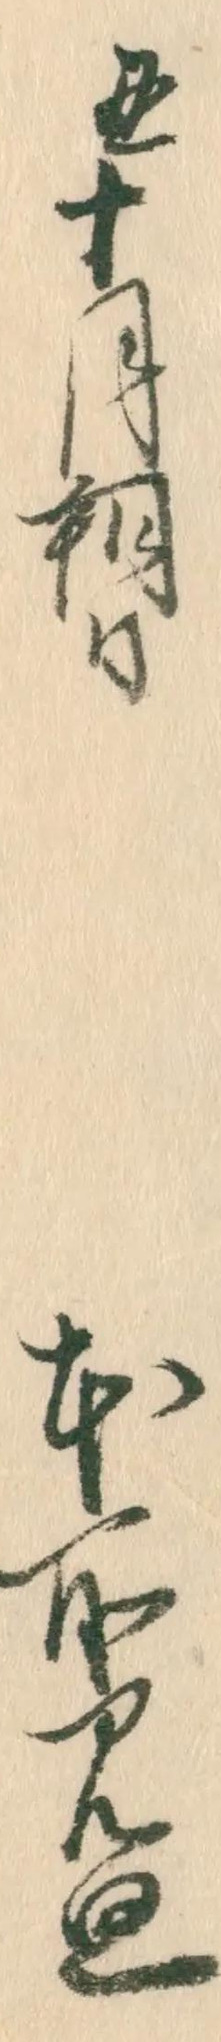丑十月朔日本所見廻

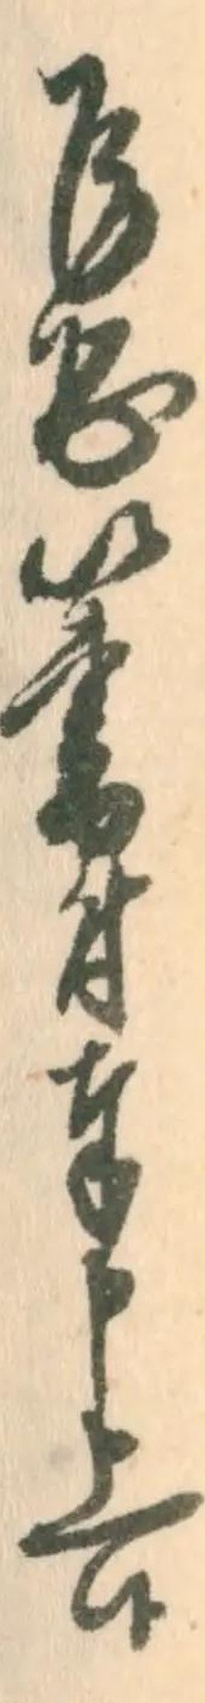乍恐以書付奉申上候
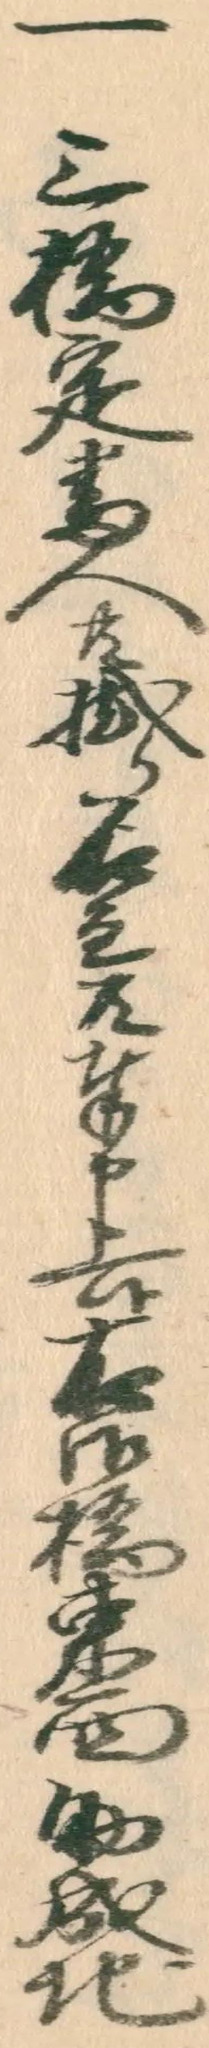一三橋定番人共掛り名主共奉申上候右御橋東西助成地
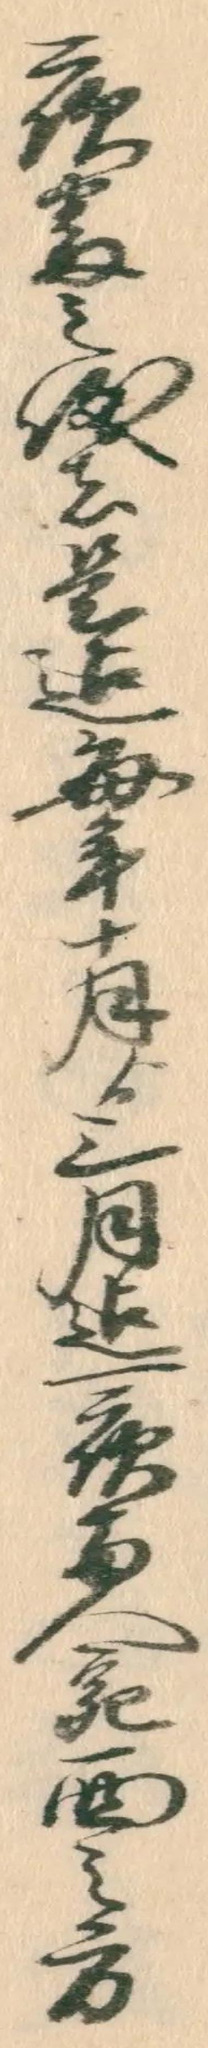夜番之儀は是迄毎年十月ゟ三月迄一夜両人宛西之方
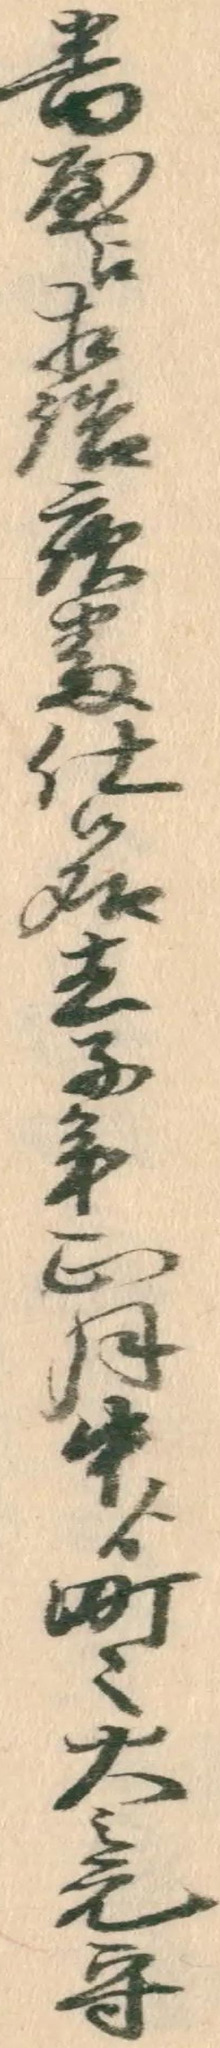番屋え相詰夜番仕候処去子年正月中ゟ町々火之元守
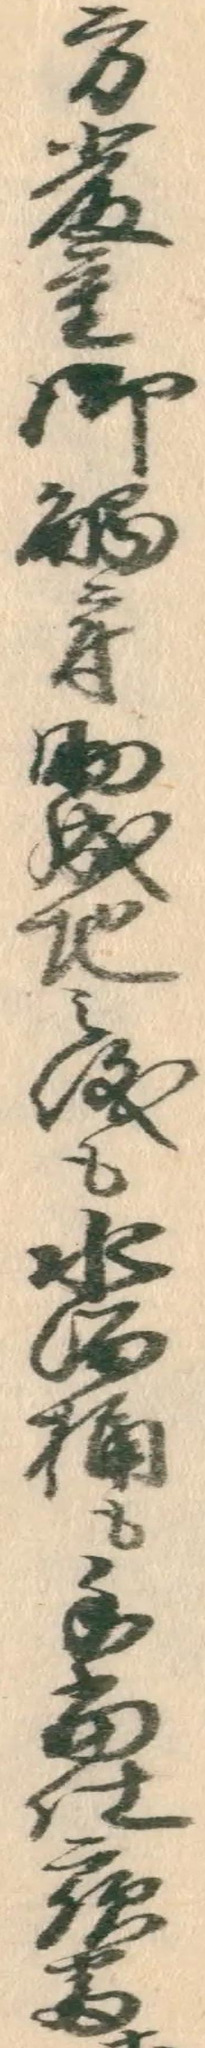方厳重御触ニ付助成地之儀も水溜桶も手当仕夜番等
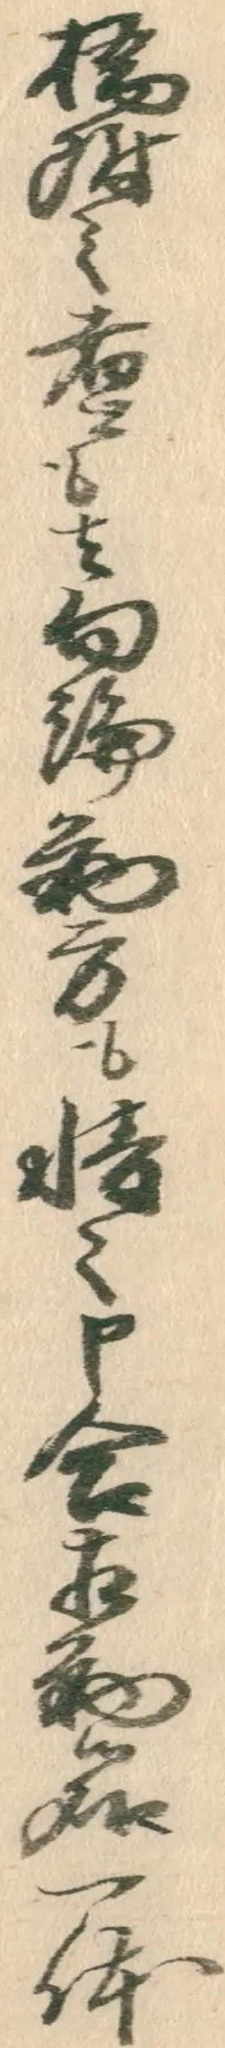橋附之者ともは勿論勤方も精々申合相勤候処一体
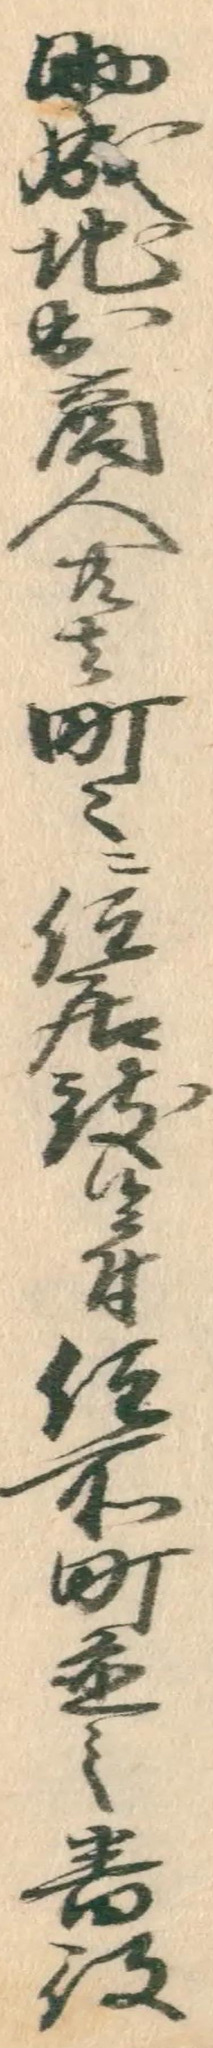助成地出商人共は町々ニ住居致候ニ付住所町並之番役

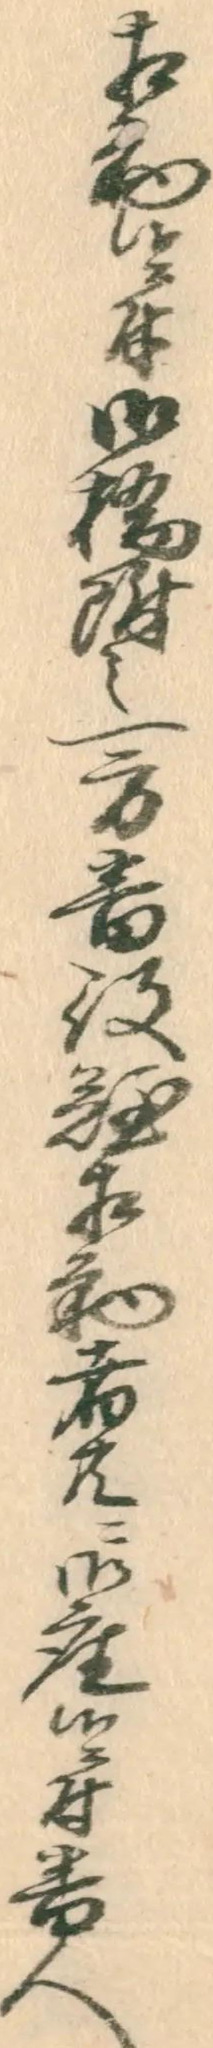相勤候ニ付御橋附之一方番役難相勤者共ニ御座候ニ付番人
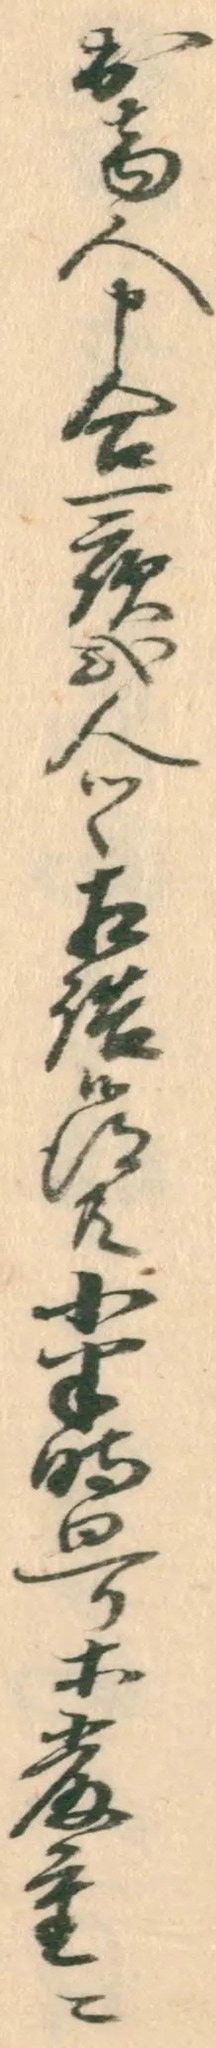出商人申合一夜弐人ツヽ相詰候得共小半時廻り等厳重ニ
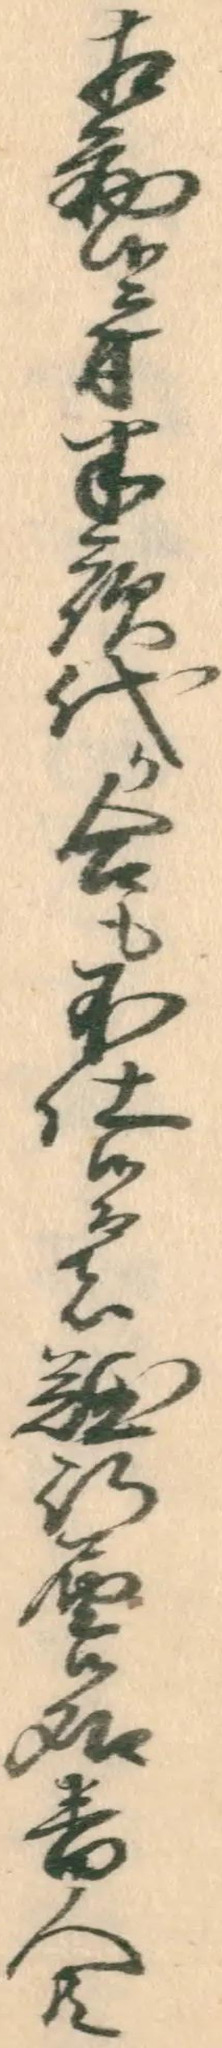相勤候ニ付半夜代り合も不仕候而は難行届候処番人共
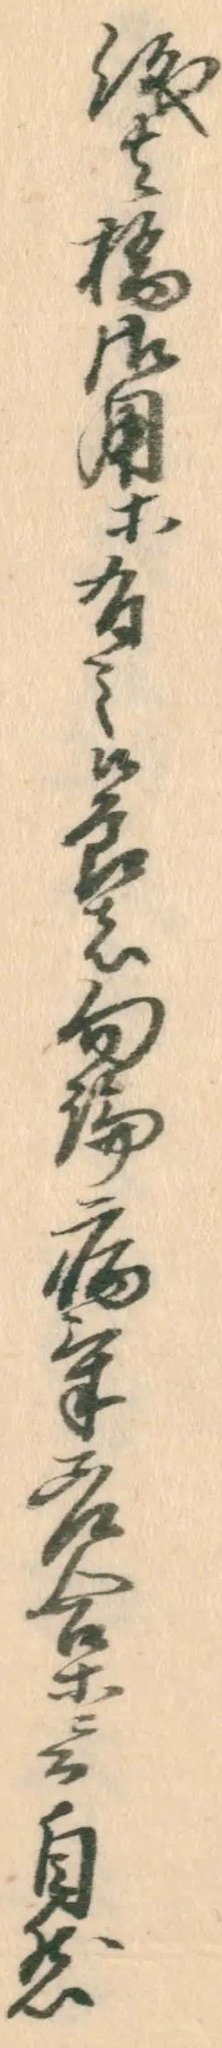儀は橋御用等有之候節は勿論病気差合等ニ而自然
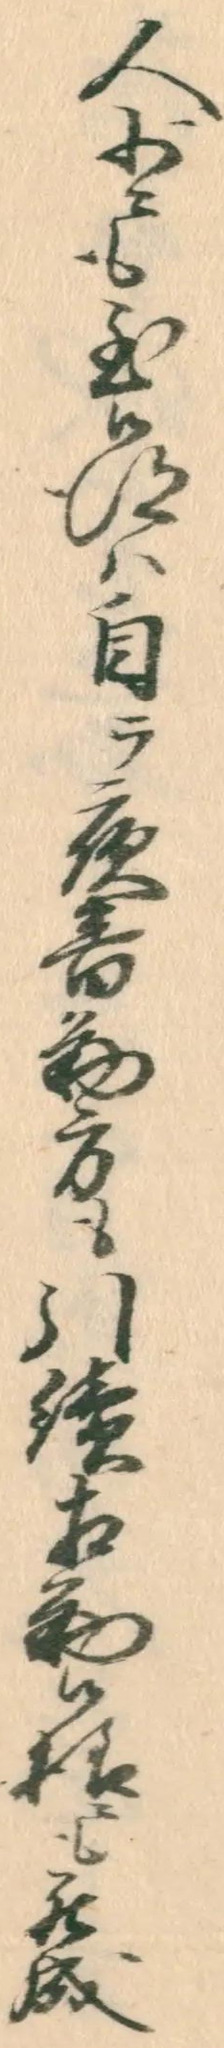人少ニも至候得ハ自ラ夜番勤方も引続相勤候様ニも罷成
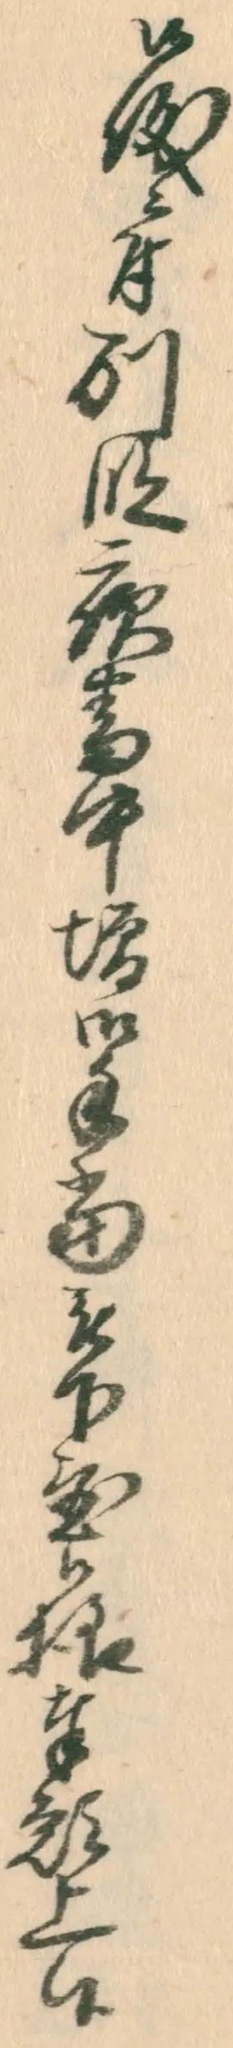候儀ニ付別段夜番中増御手当被下置候様奉願上候
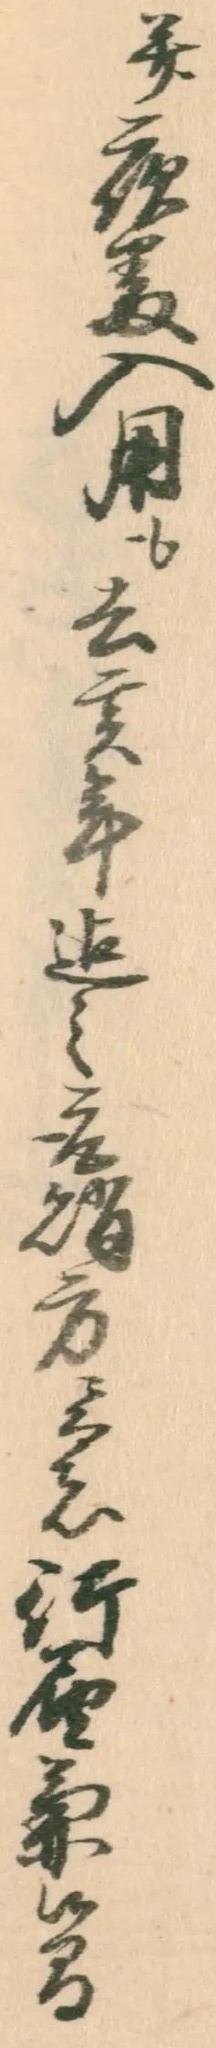并夜番入用も去亥年迄之取賄方ニ而は行届兼候間
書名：三橋 17巻. [7] 三橋小破御修復書留　但御奉行御掛リ替地震潰橋番屋　嘉永四亥年より安政二卯年迄　上
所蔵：国立国会図書館 National Diet Library, JAPAN
